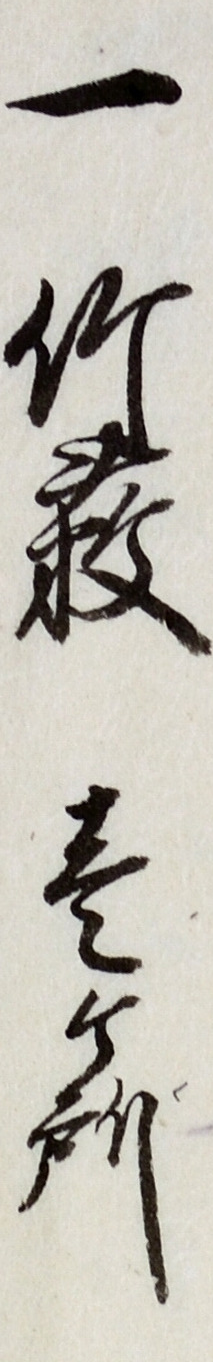一竹藪壱ケ所
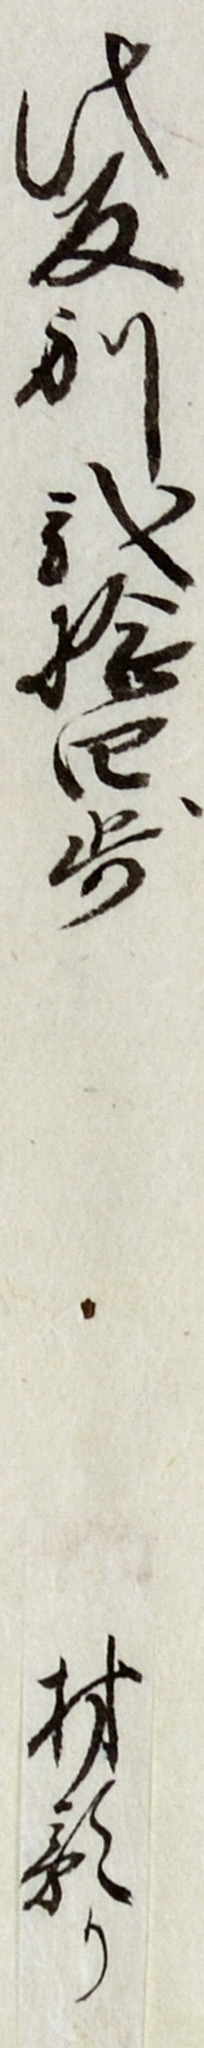此反別弐拾四歩村影り

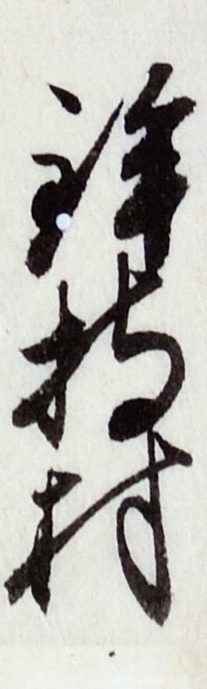鉾持村
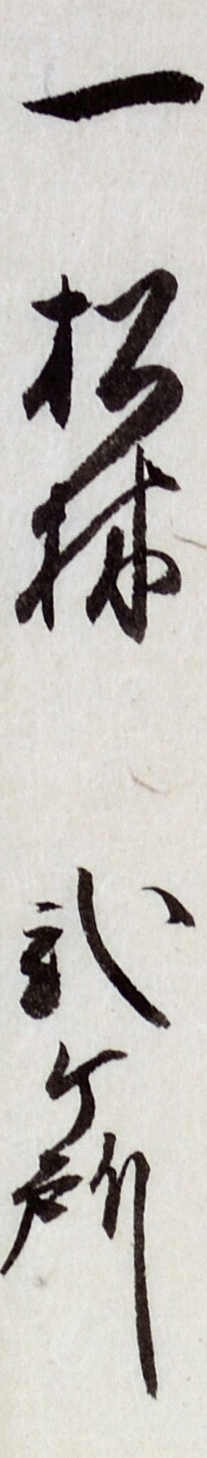一松林弐ケ所
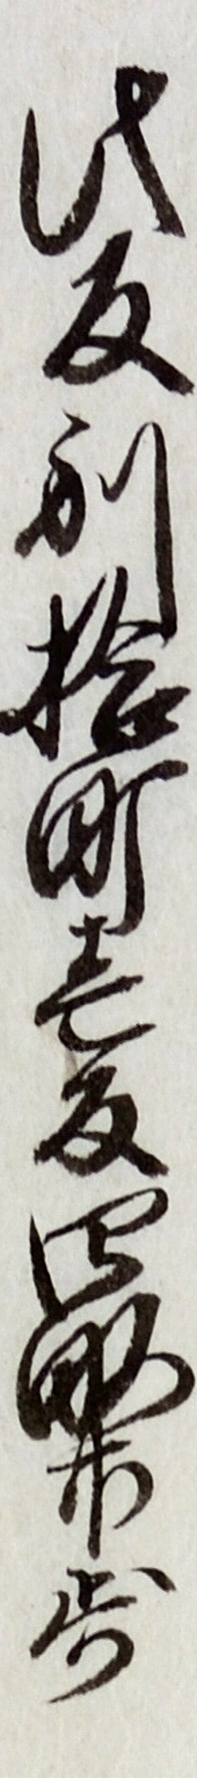此反別拾町壱反四畝廿歩
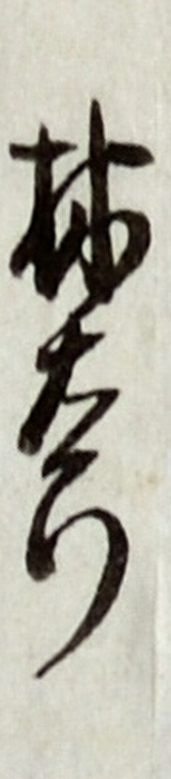林右衛門
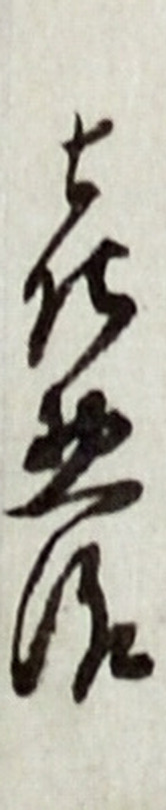喜惣治
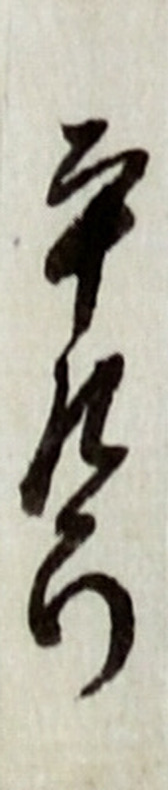平左衛門
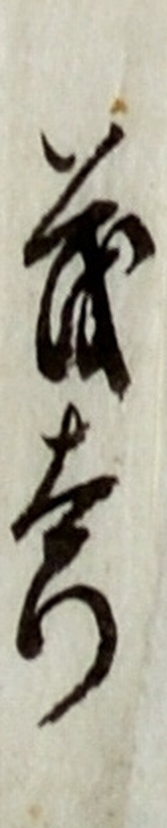林右衛門
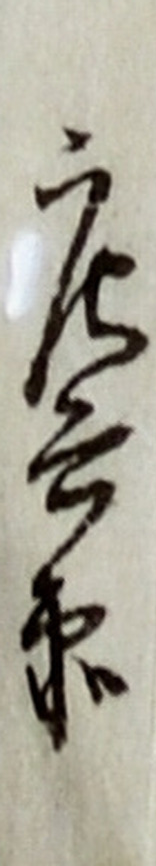庄兵衛

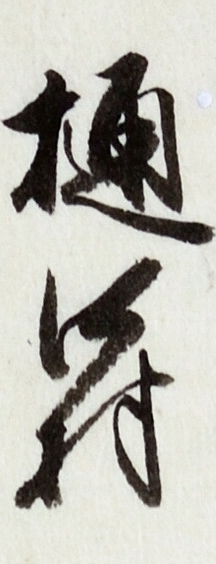樋口村
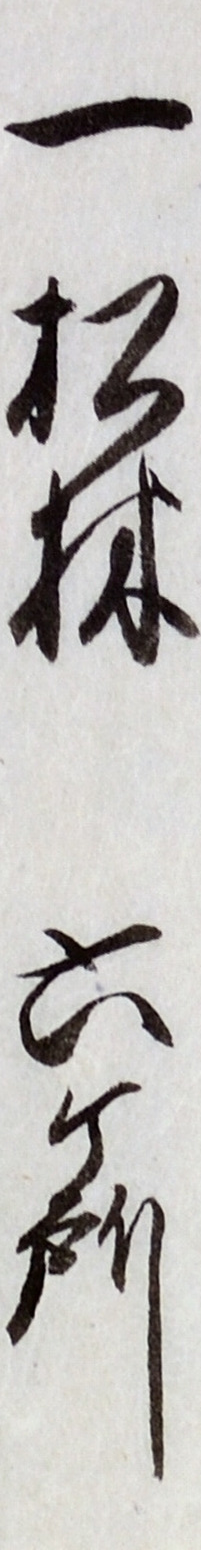一松林六ケ所
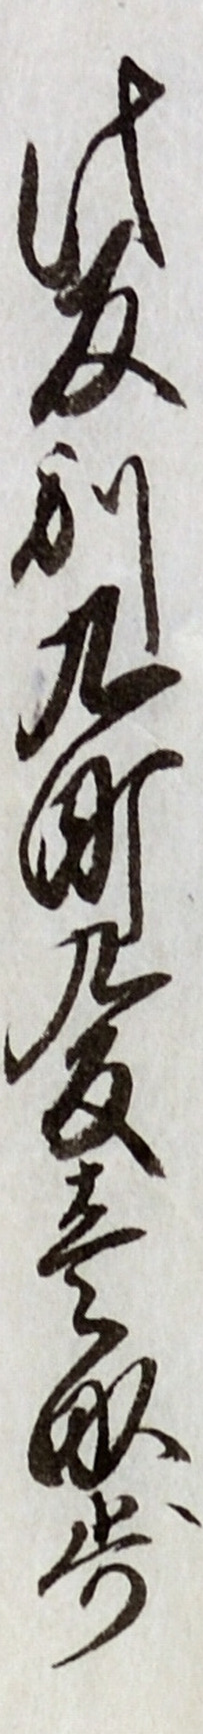此反別九町九反壱畝歩

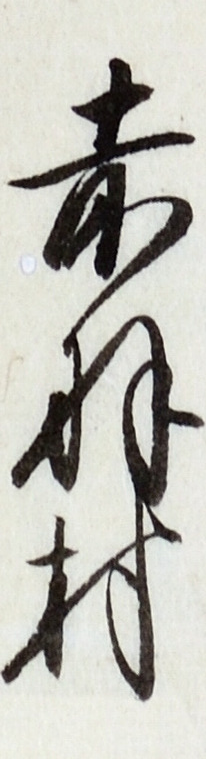赤羽村
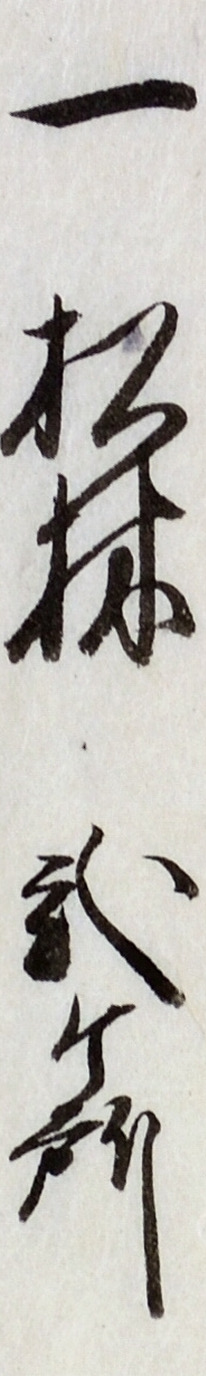一松林弐ケ所
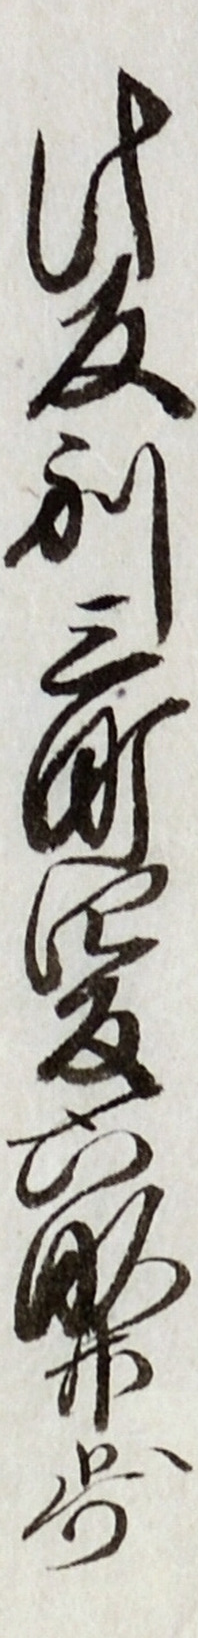此反別三町四反六畝廿歩
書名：御領分中御林御藪附帳
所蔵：伊那市立高遠町図書館・合同会社AMANE
